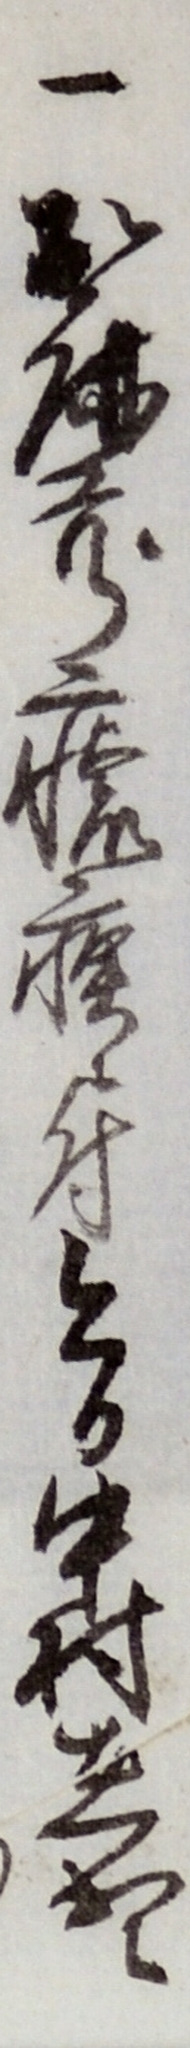一麗蔵瘧疾ニ付今日中村在出候
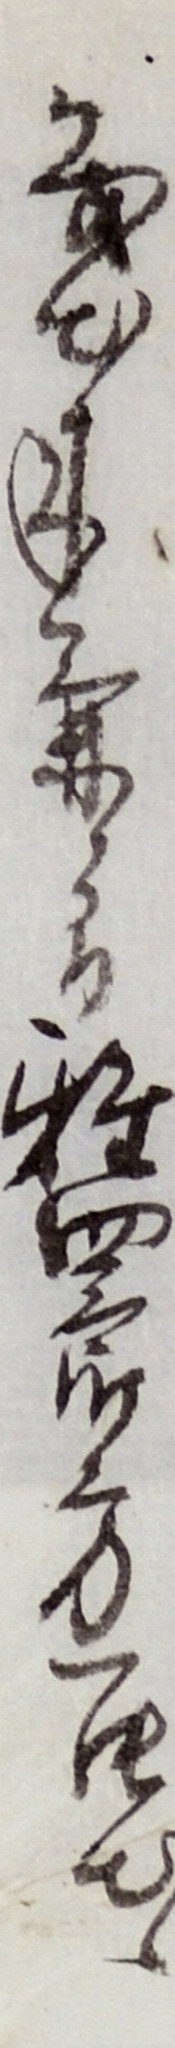義出来兼候間雅四郎方罷出候
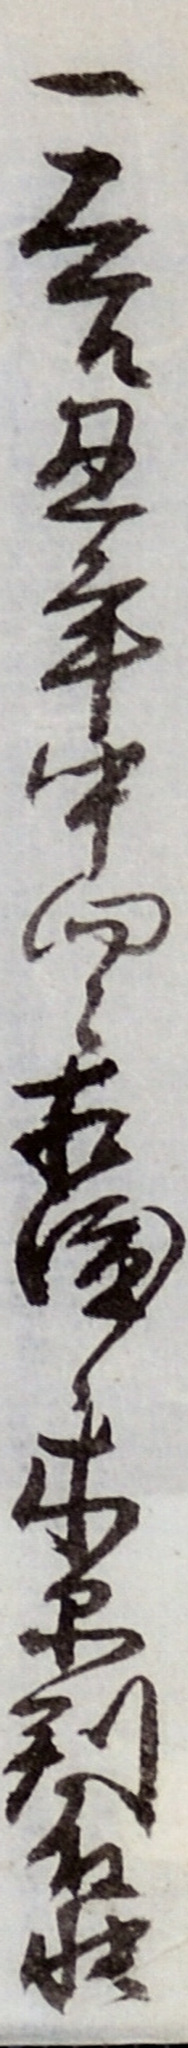一去ル丑年中向々相渡候木品判取帳
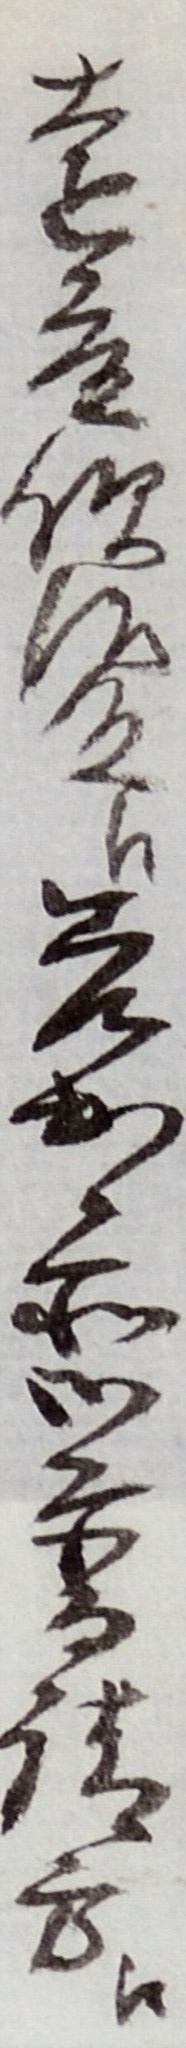遠藤欣治殿江差出候所御普請方江
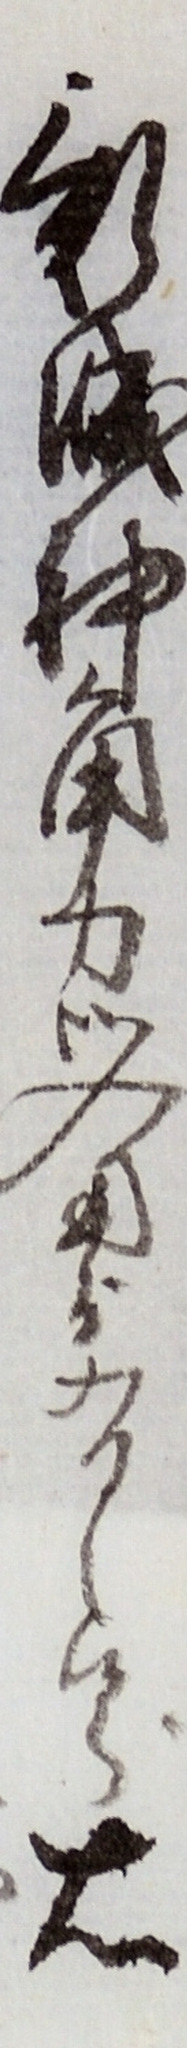新城神角力御入用分有之候分右
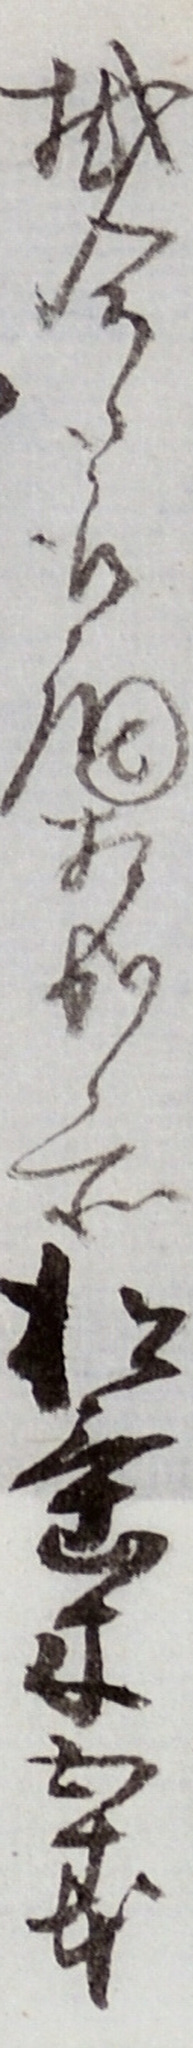掛合御取調相成候所松垂木五十本
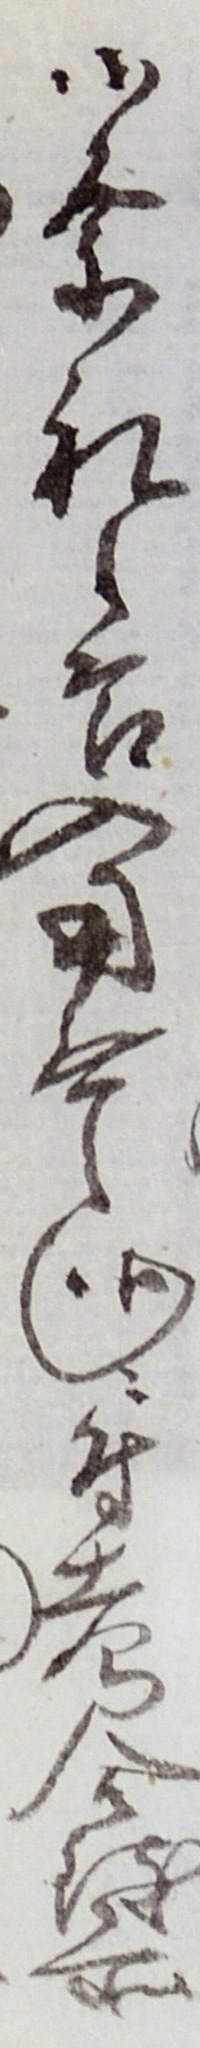御祭礼之節入用無之趣ニ付考合致候所
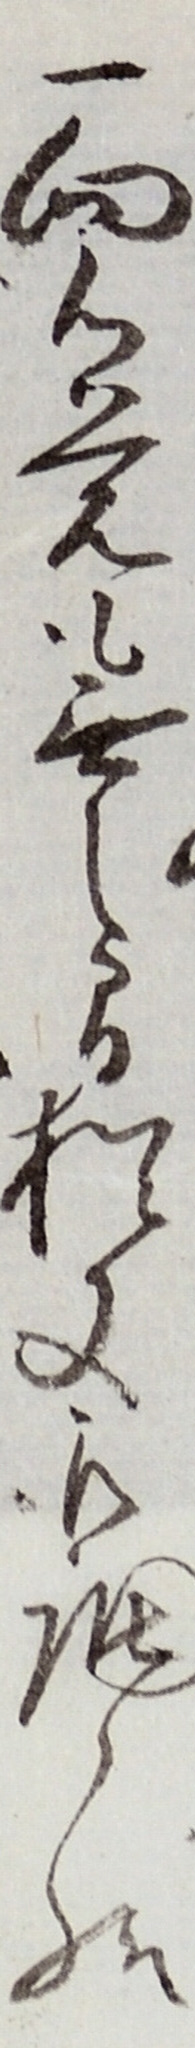一向心覚も無之間猶又取調候様
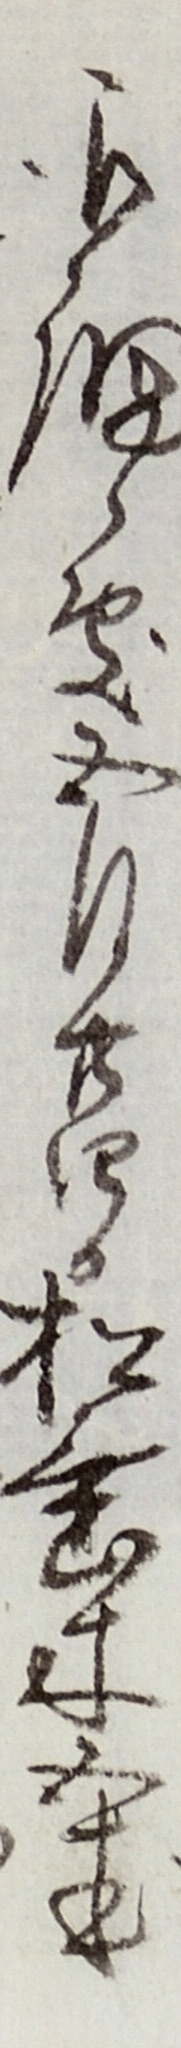取調候処五月廿四日松垂木五十本
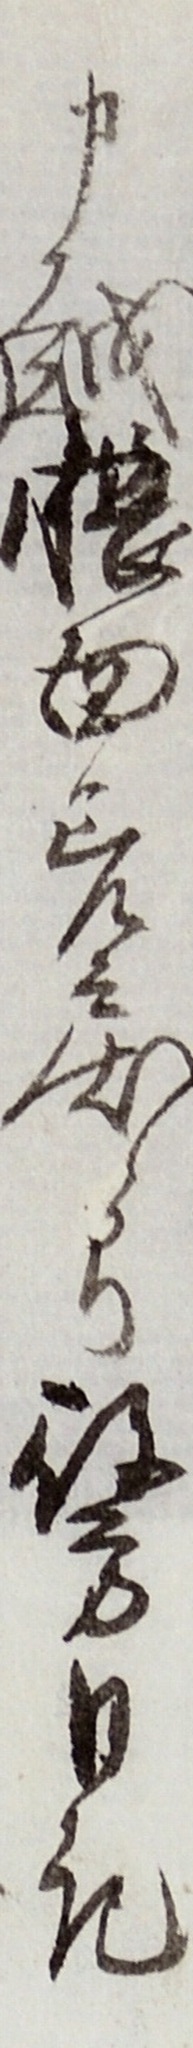申越帳面差戻候間役方日記
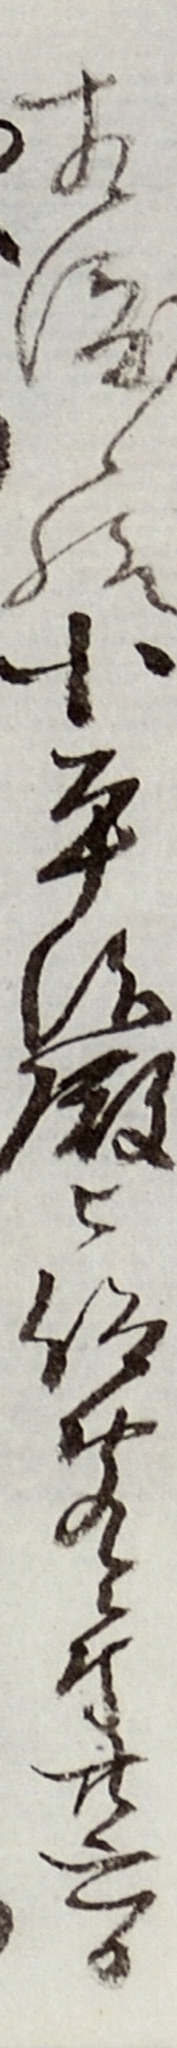相渡候様小平治殿被仰聞候ニ付廿六日
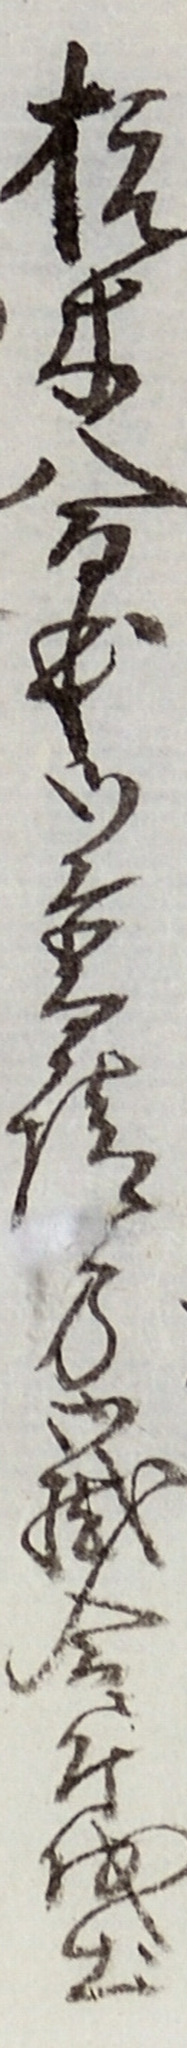枕木八百本御普請方御掛合ニ付伐出
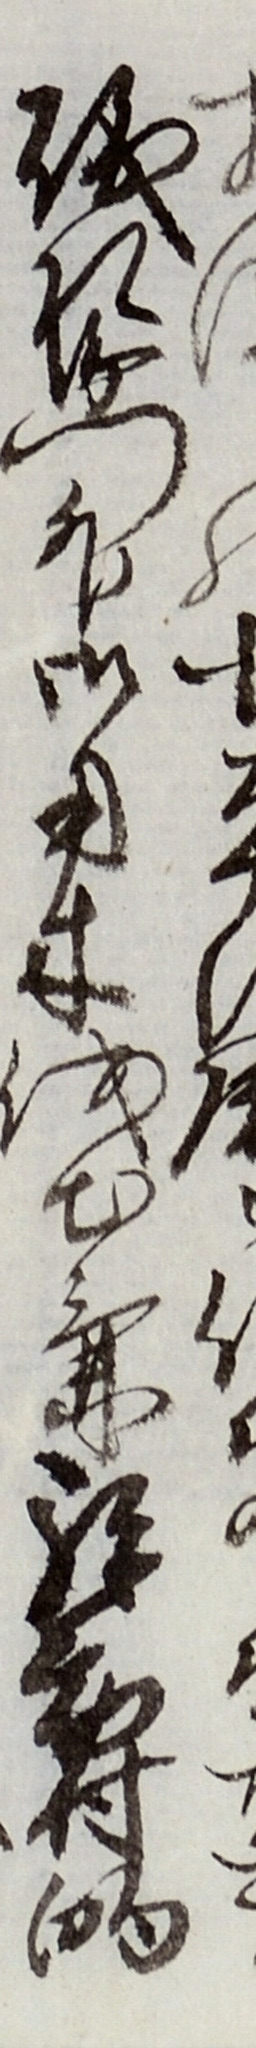磯左衛門外御用木伐出兼弥勒村的
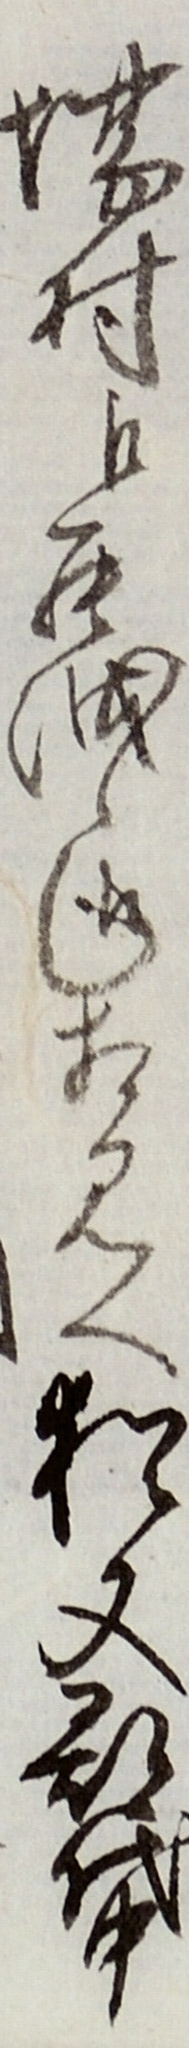場村江罷越候趣相見へ猶又郡代中
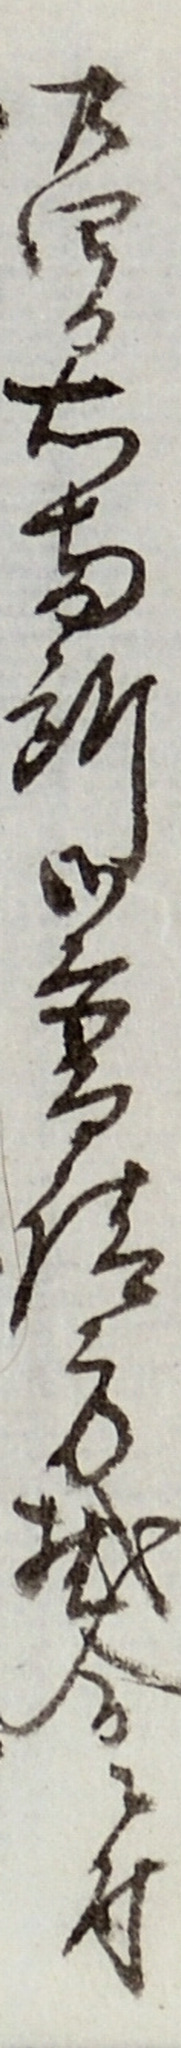廿四日右両所御普請方掛合ニ付
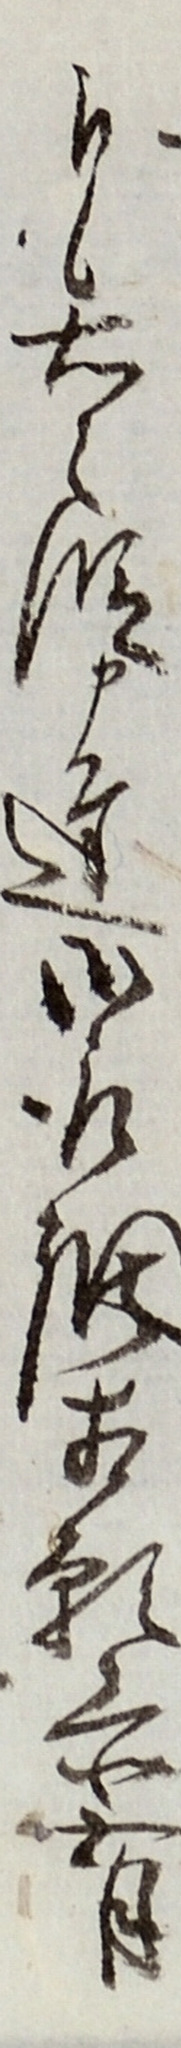江も右之段申達御取調相願候所五月
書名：御山方御薪方諸事御用留
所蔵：伊那市立高遠町図書館・合同会社AMANE
